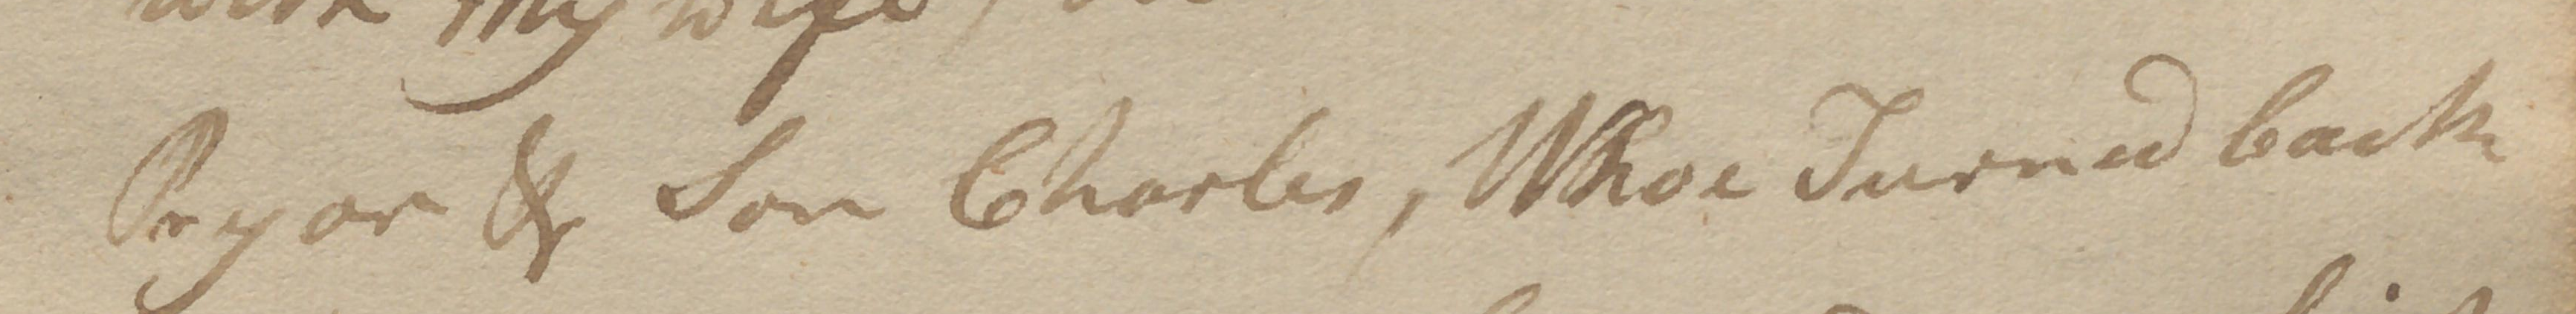Pryor & Son Charles, Whoe Turned back
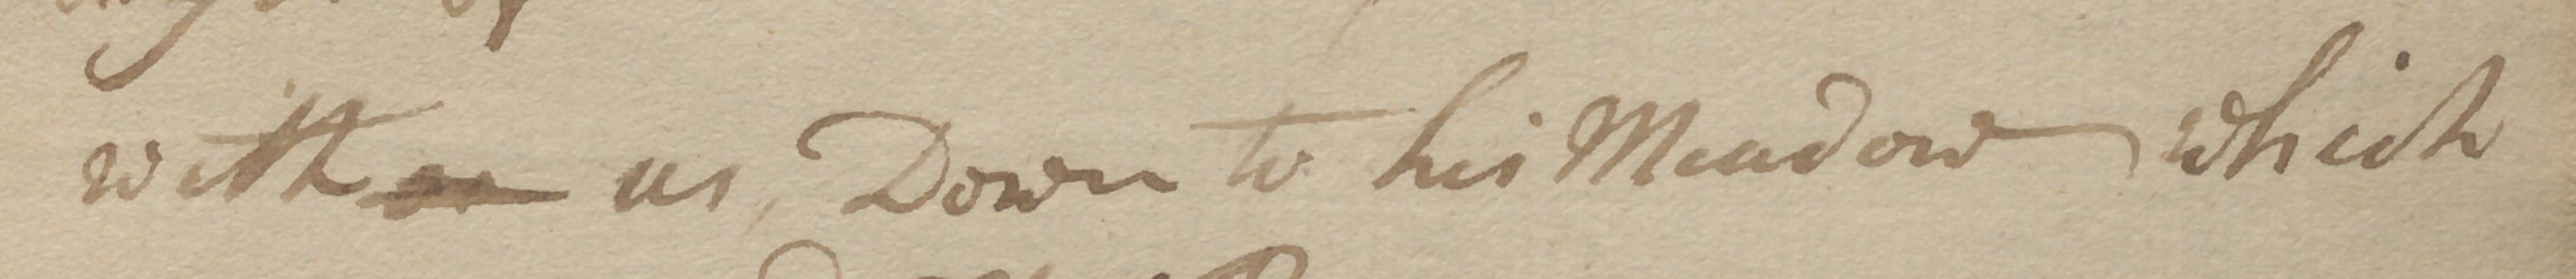with[ou] us, Down to his Meadow which
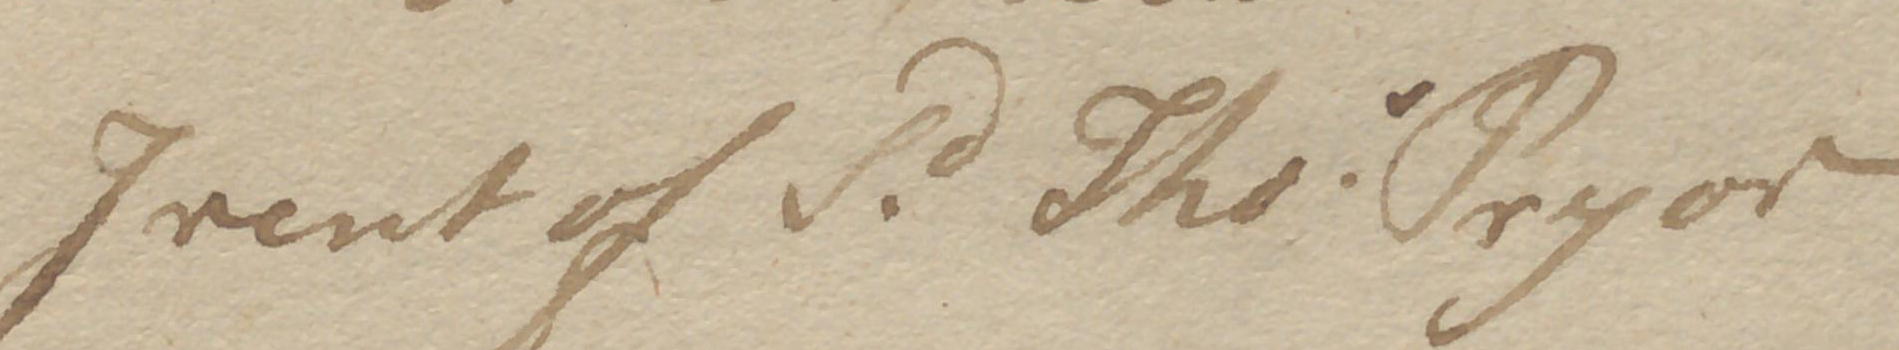I rent of s^d. Tho^s. Pryor
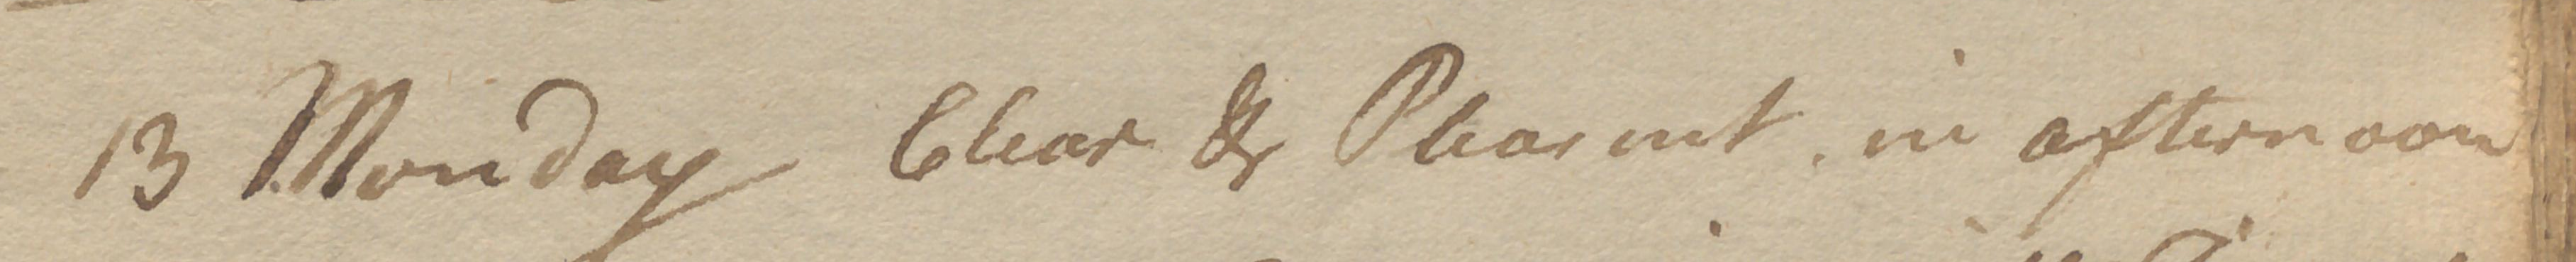13 Monday Clear & Pleasent, in afternoon
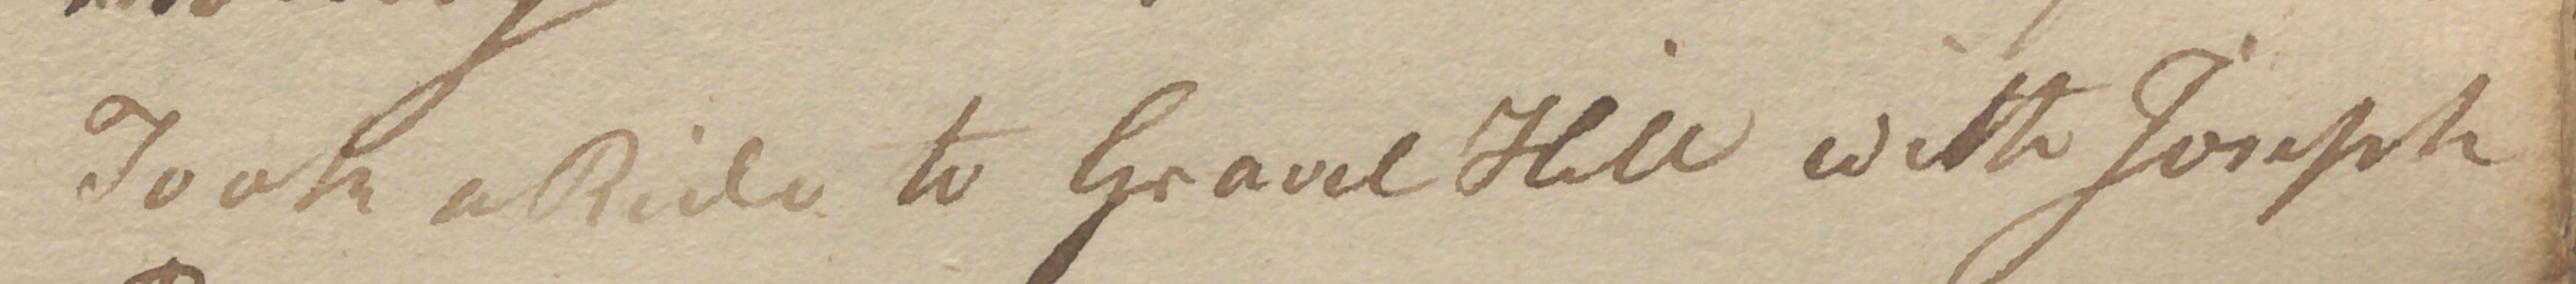Took a Ride to Gravel Hill with Joseph
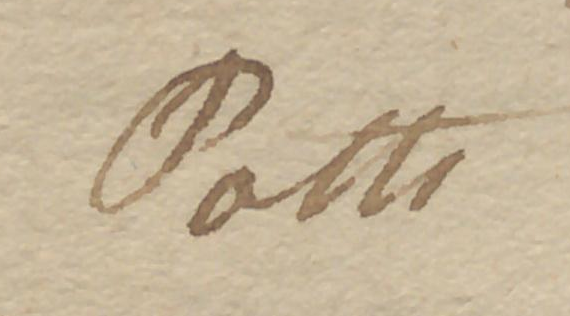Potts
